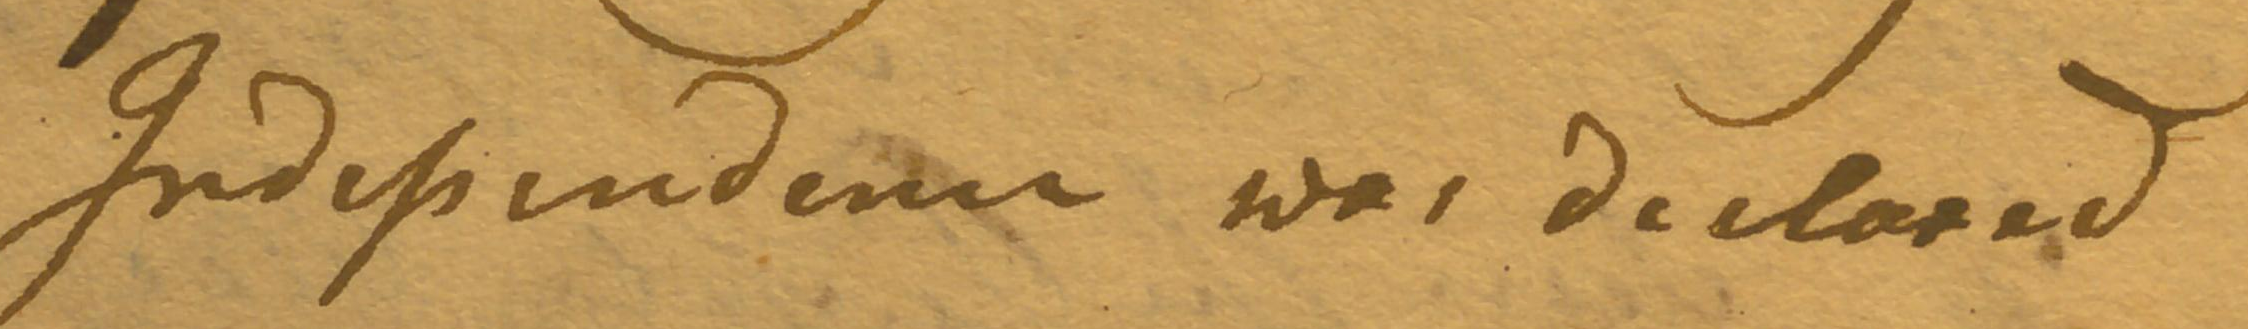Independence was declared
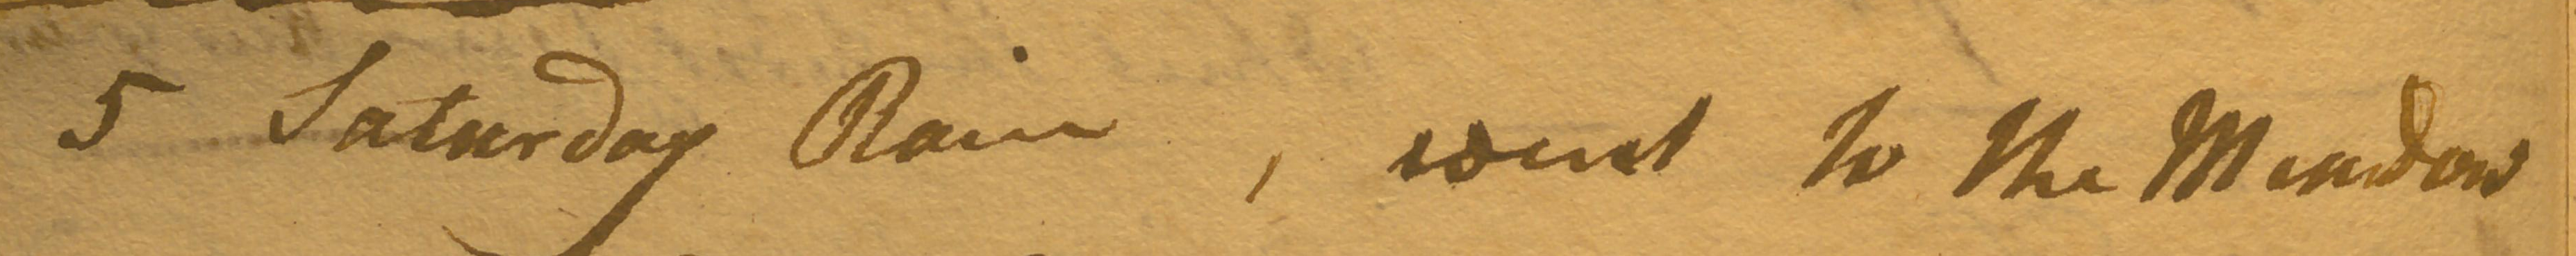5 Saturday Rain, went to the Meadow
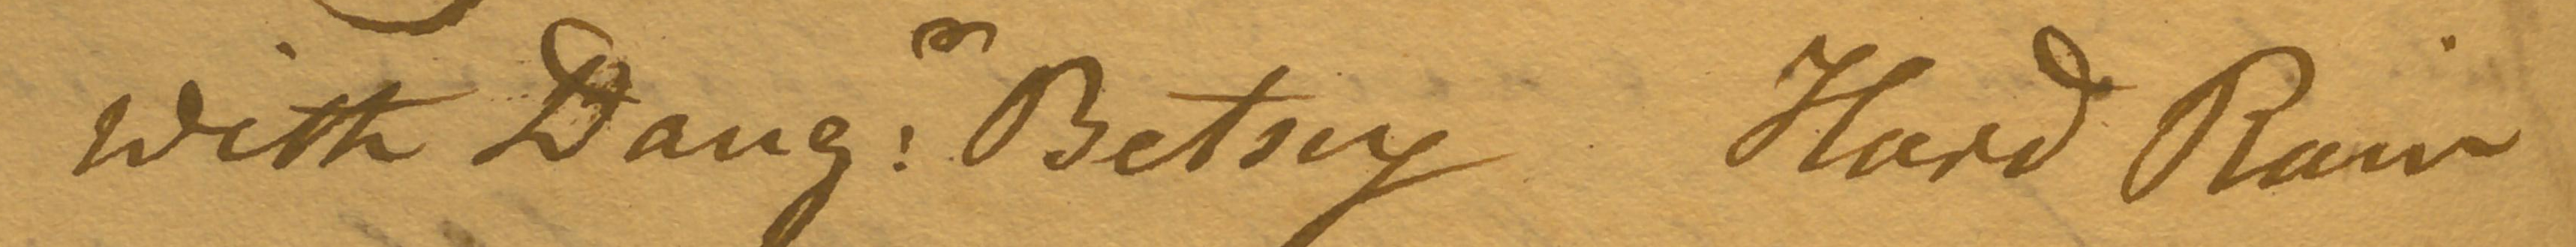with Daug^r. Betsey Hard Rain
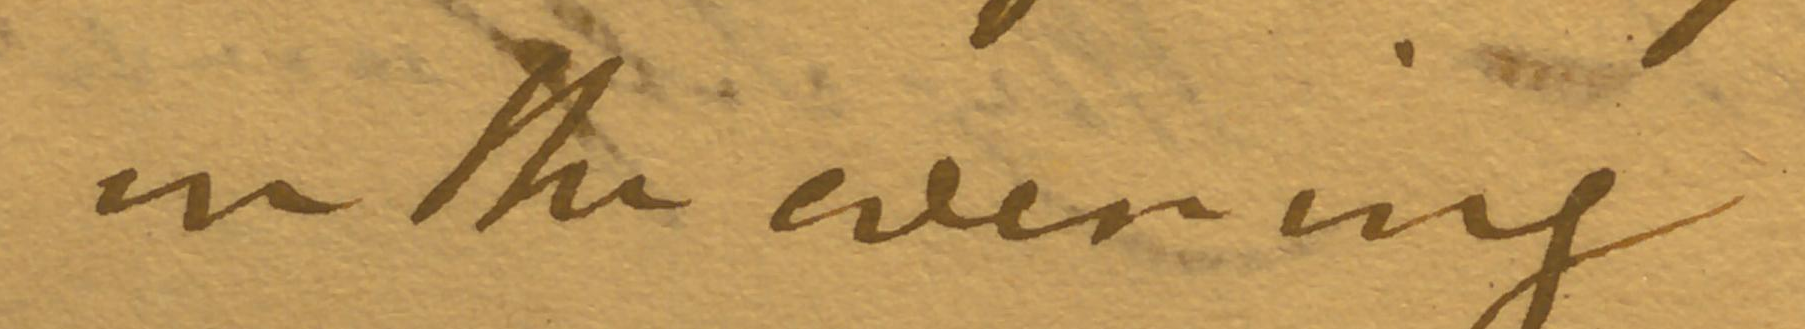in the evening
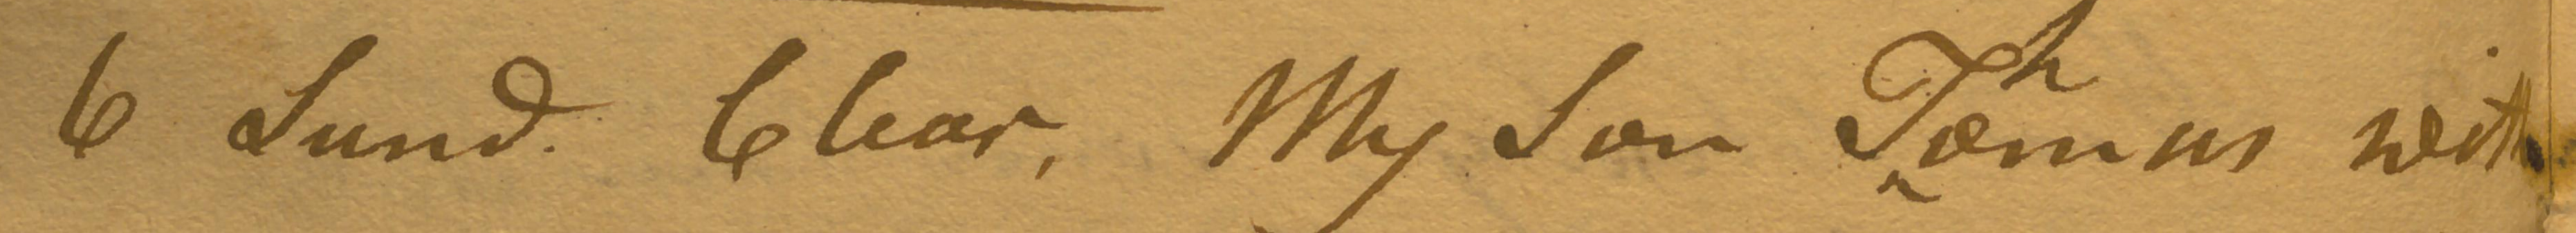6 Sund. Clear. My Son T^homas with
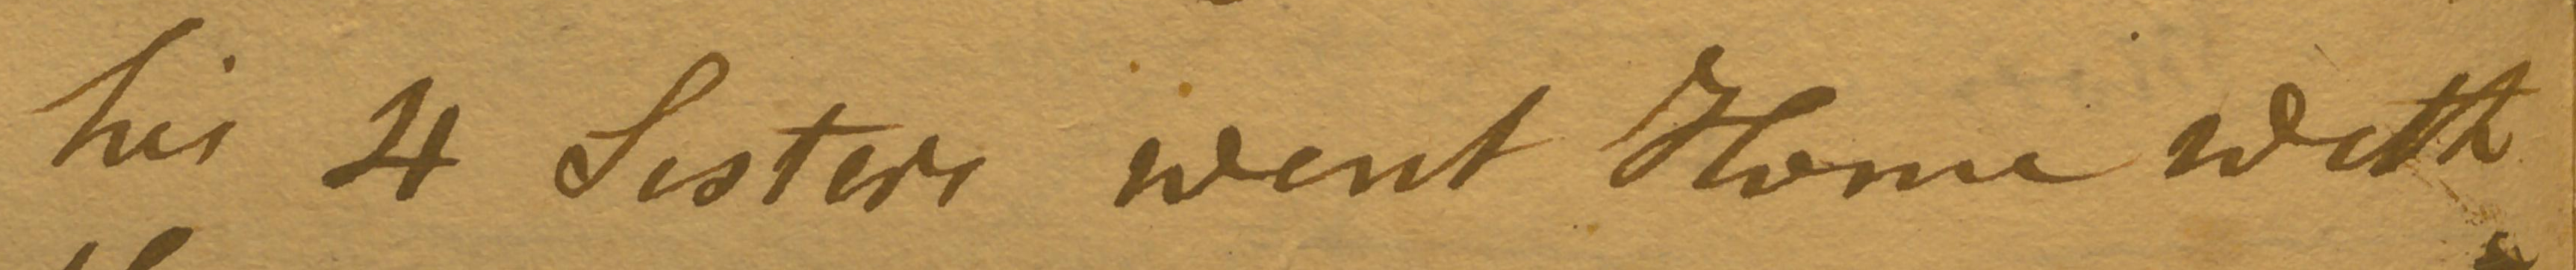his 4 Sisters went Home with
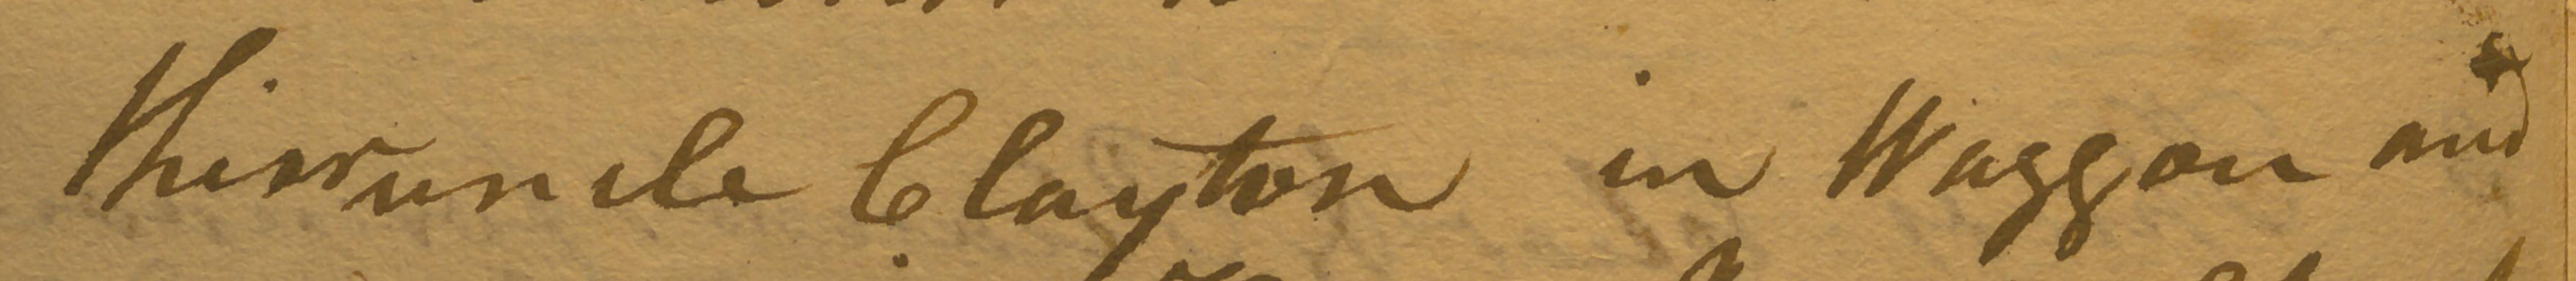their uncle Clayton in Waggon and
